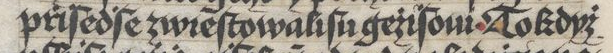pṙiẛedẛe zwieſtowali ſu geżiẛoui.To kdyż
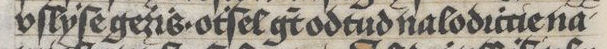vſlyẛe geżiṡ.otẛel ḡt odtud nalodiċcie na
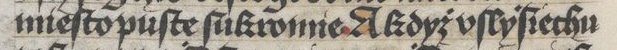míeſto puſte ſukromie.A kdyż vſlyẛiechu
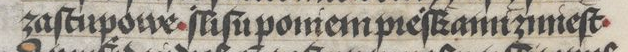zaſtupowe.ẛli ſu poniem pieẛkami zmieſt.
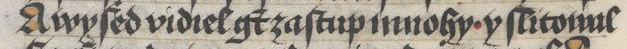A wyẛed vidiel ḡt zaſtup mnohy.y ſlitowal
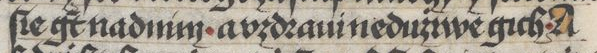ſie ḡt nad ním.a vzdraui nedużiwe gich.A
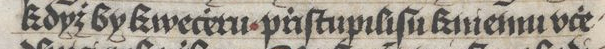když by kweċeru.pṙiſtupili ſu k niemu vċe¬
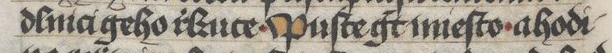dlnici geho ṙkuce.Puſte ḡt mieſto.a hodi¬
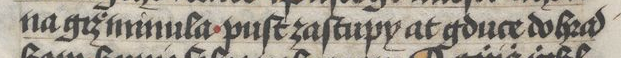na giz minula.puſt zaſtupy at gduce do hrad¬
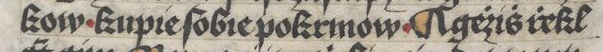kow.kupíe ſobie pokrmow.Ageżíṡ ṙekl
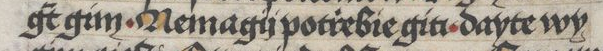ḡt gim.Nemagij potṙebie gíti.dayte wy¬
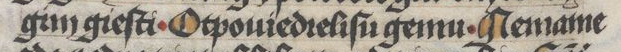gim gíeſti.Otpouiedieliſu gemu.Nemame
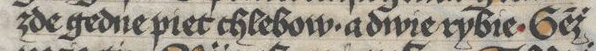zde gedne piet chlebow.a dwie rybie.Gēż
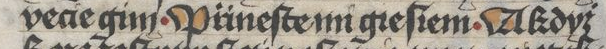vecie gim.Pṙineſte mi gie ſiem.A kdyż
